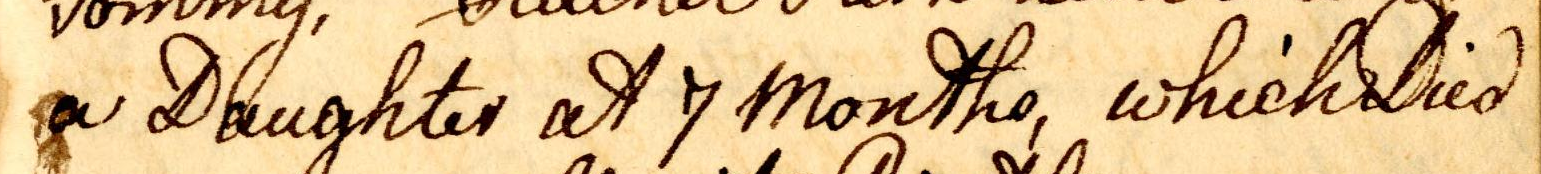a Daughter of 7 Months, which Died
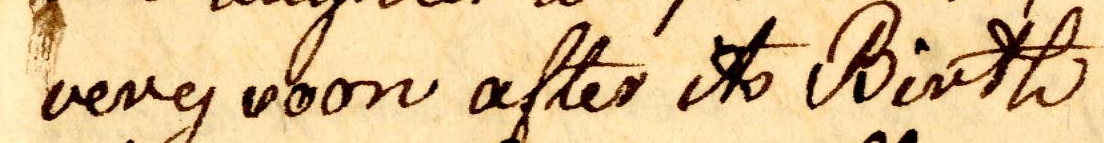very soon after its Birth
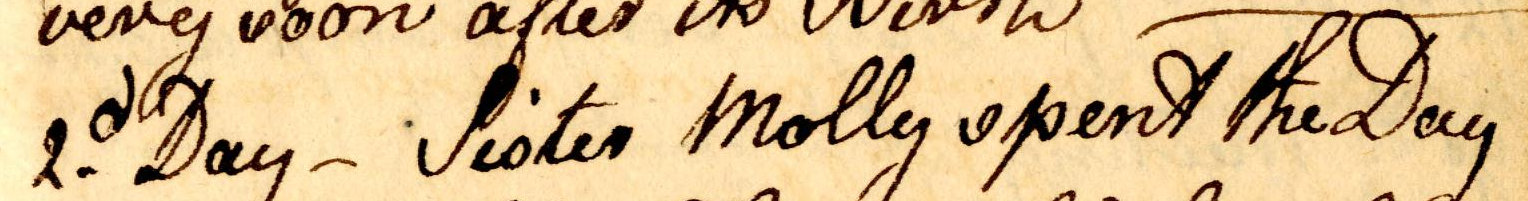2^d. Day- Sister Molly spent the Day
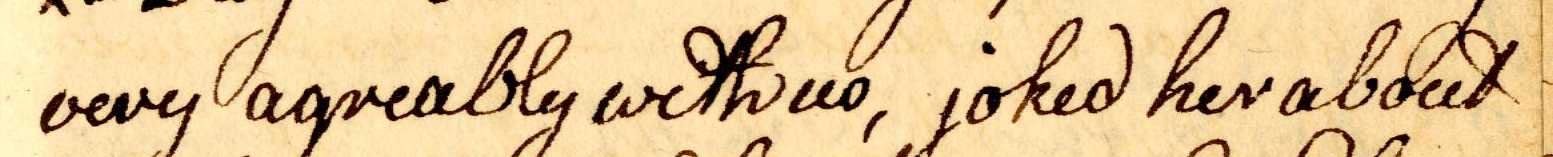very agreably with us, joked her about
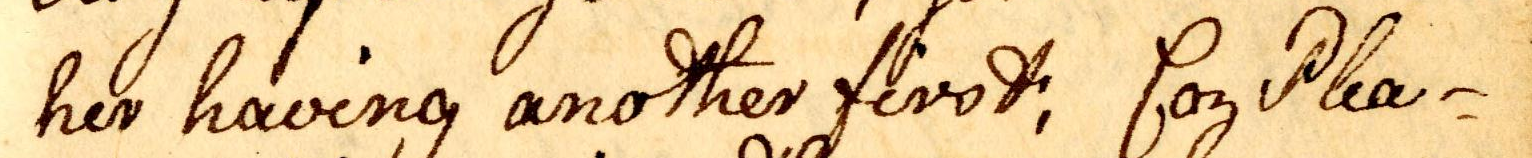her having another first, Coz Plea-
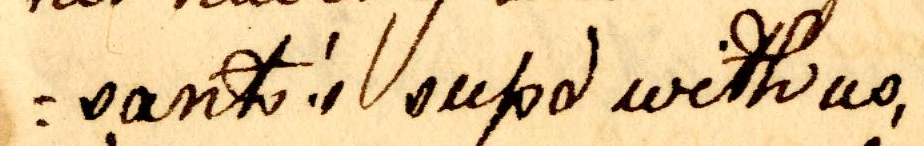-sants's supd with us,
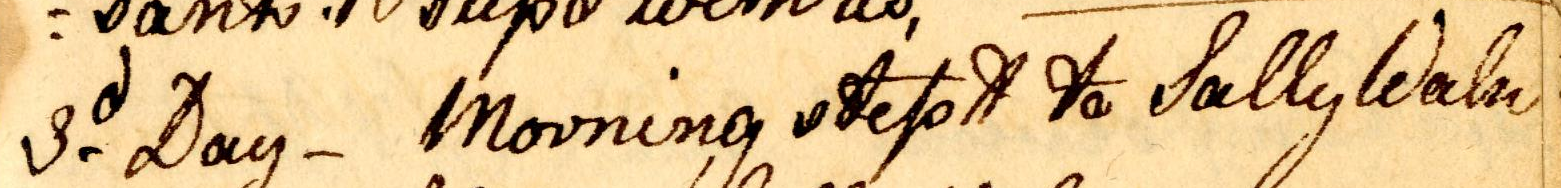3^d Day- Morning stept to Sally Waln
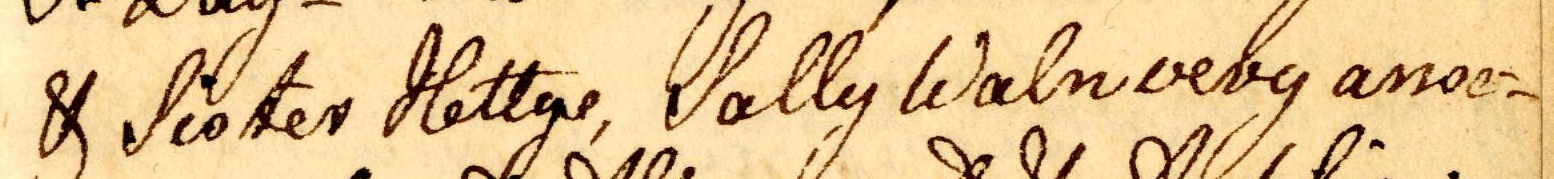& Sister Hettys, Sally Waln very anx-
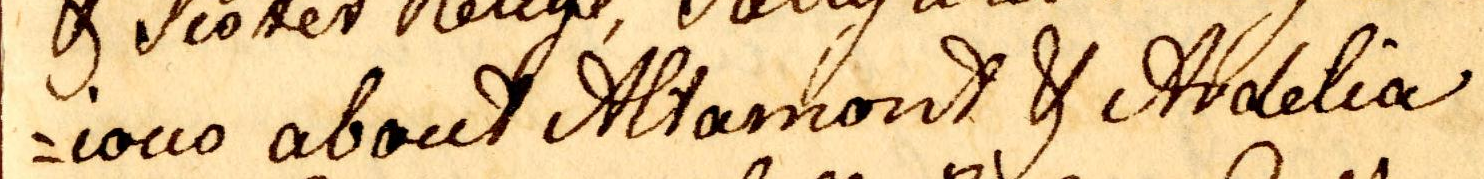-ious about Altamont & Ardelia
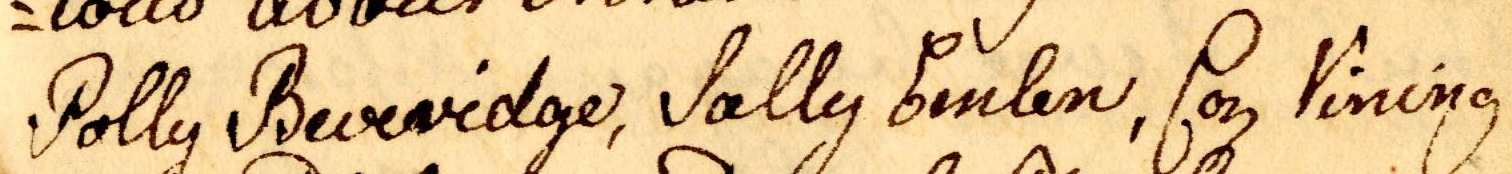Polly Beveridge, Sally Emlen, Coz Vining
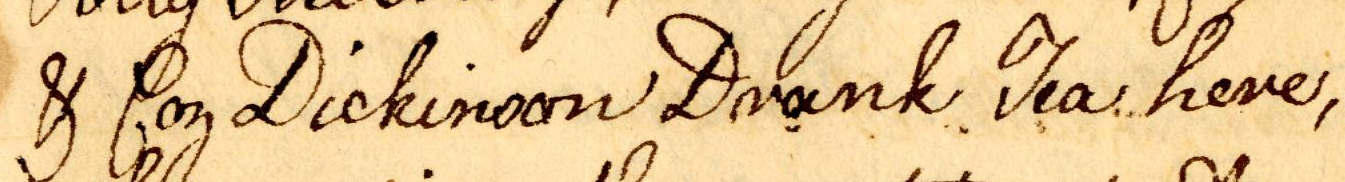& Coz Dickinson Drank Tea here,
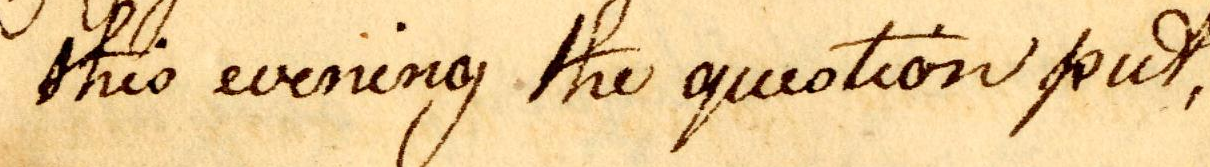this evening the question put,
